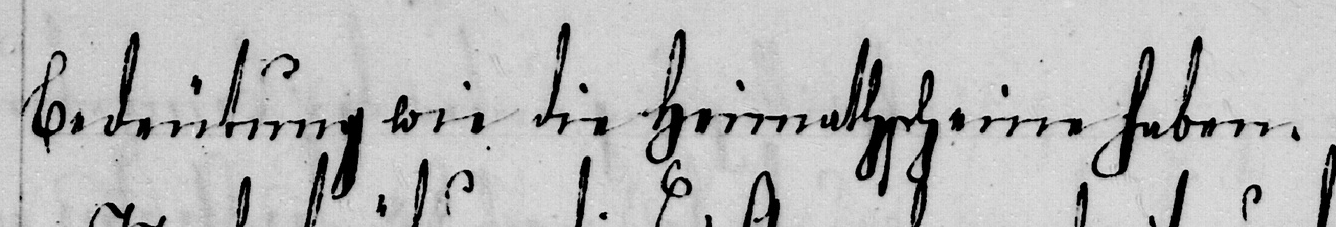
Bedeutung wie die Heimathscheine haben.
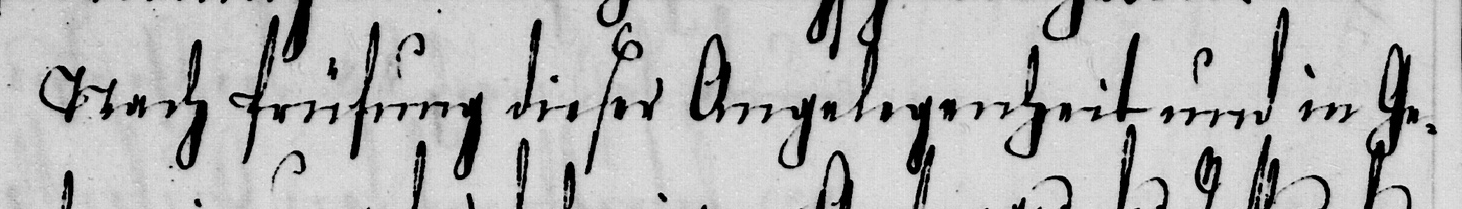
Nach Prüfung dieser Angelegenheit und in Ge¬
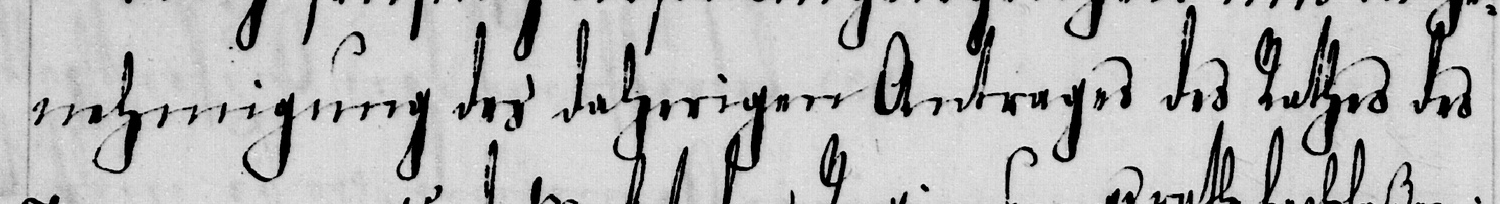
nehmigung des daherigen Antrages des Rathes des
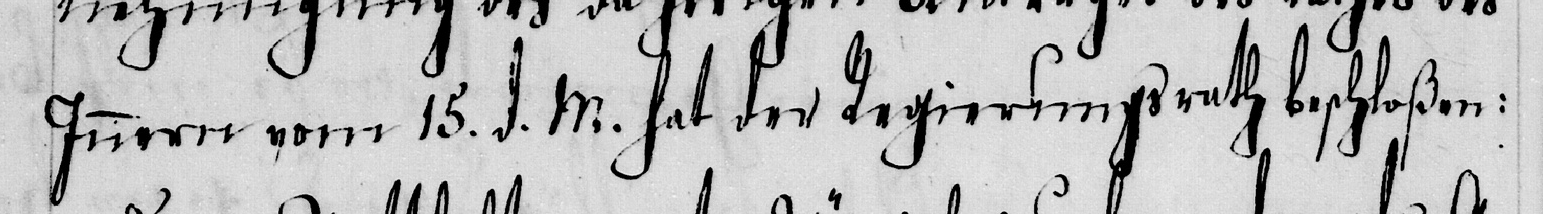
Innern vom 15. d. M. hat der Regierungsrath beschloßen:
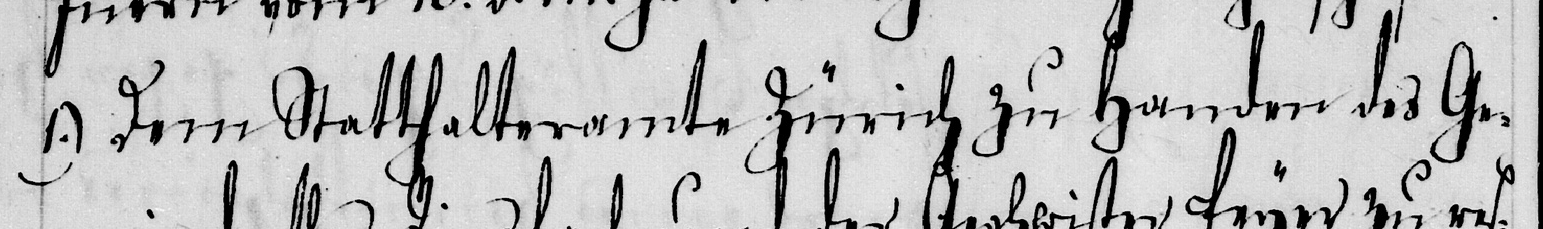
1.) Dem Statthalteramte Zürich zu Handen des Ge¬
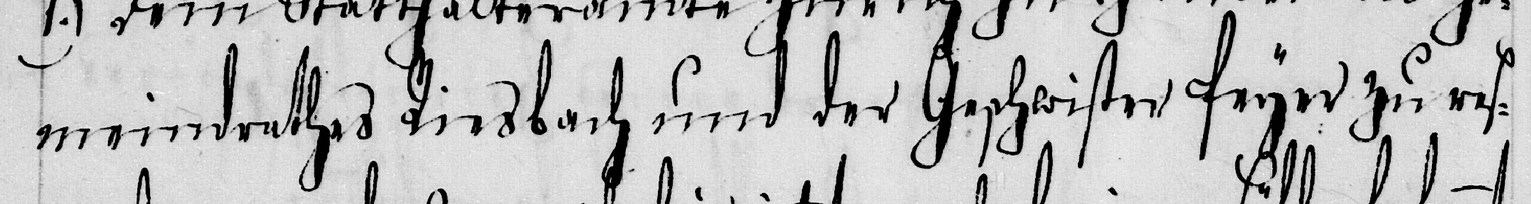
meindrathes Riesbach und der Geschwister Peyer zu res¬
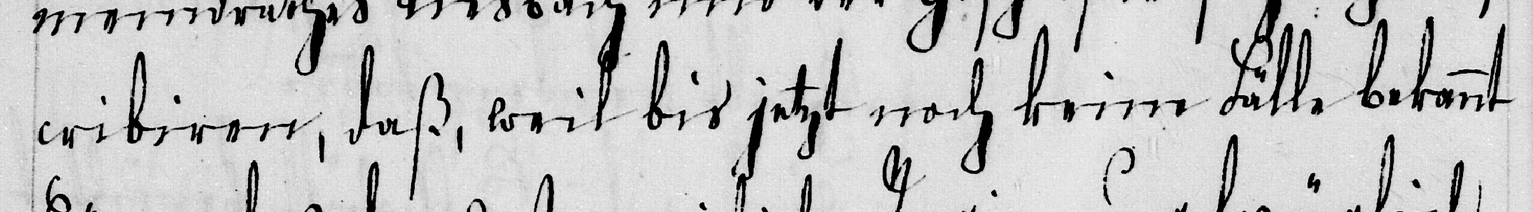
cribiren, daß, weil bis jetzt noch keine Fälle bekannt
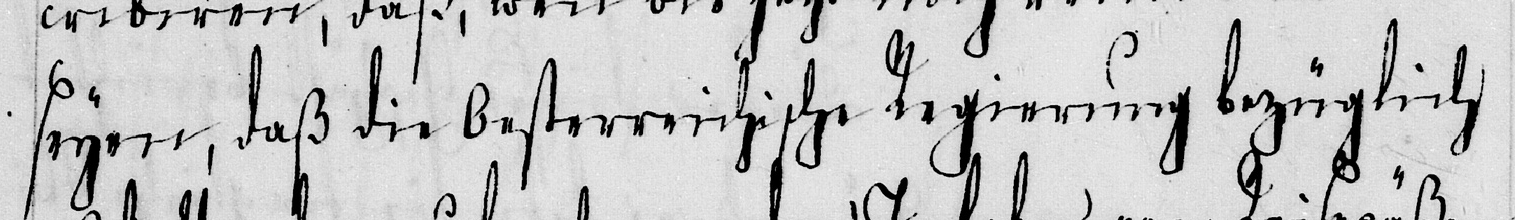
seyen, daß die Oesterreichische Regierung bezüglich
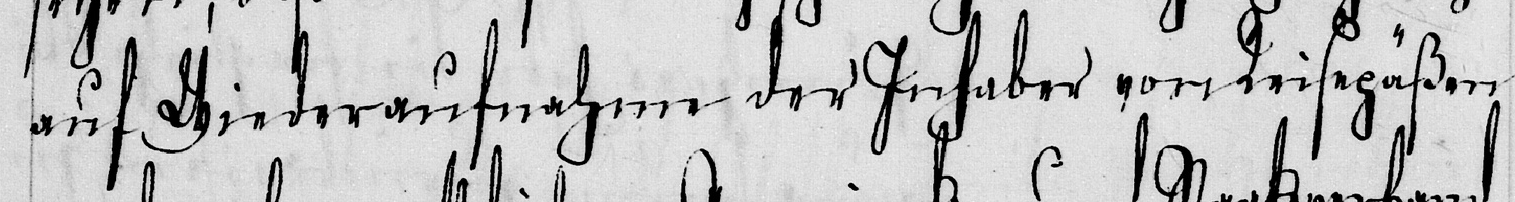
auf Wiederaufnahme der Inhaber von Reisepäßen
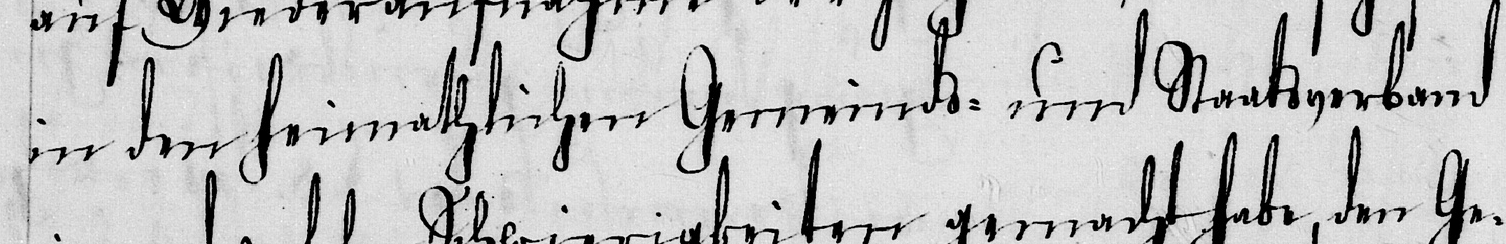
in den heimathlichen Gemeinds- und Staatsverband
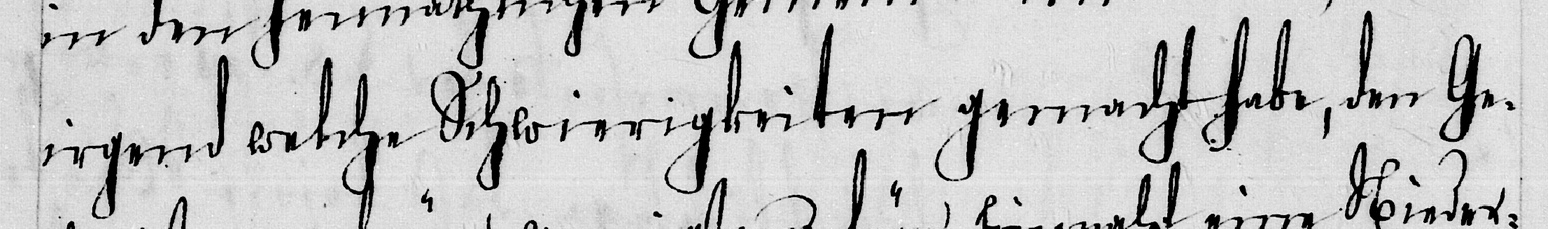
irgend welche Schwierigkeiten gemacht habe, den Ge¬
